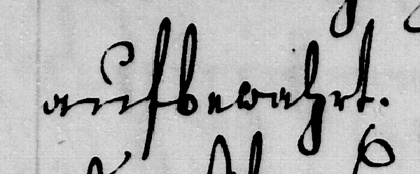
aufbewahrt.
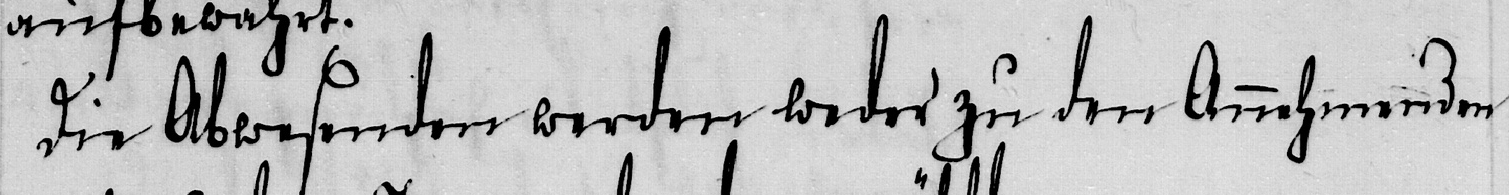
Die Abwesenden werden weder zu den Annehmenden
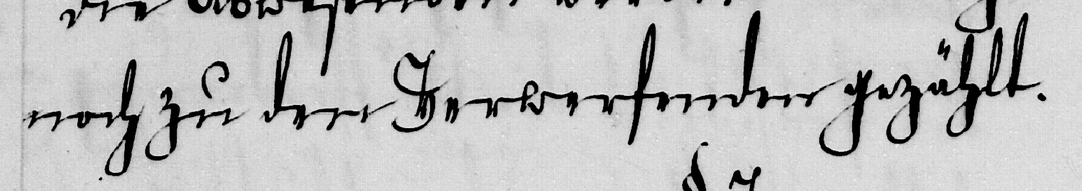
noch zu den Verwerfenden gezählt.
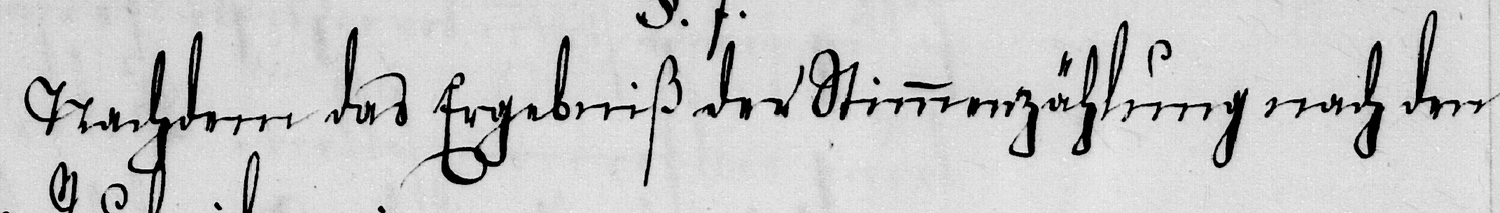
Nachdem das Ergebniß der Stimmzählung nach den
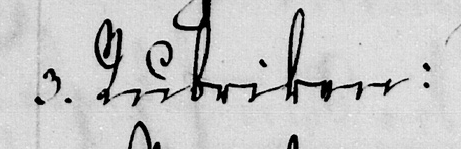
3. Rubriken:
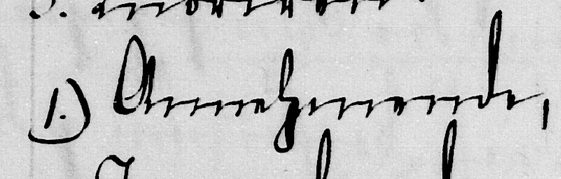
1.) Annehmende,
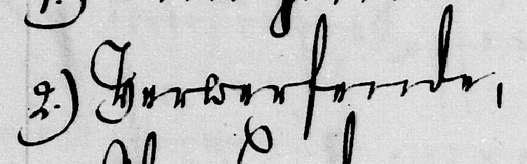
2.) Verwerfende,
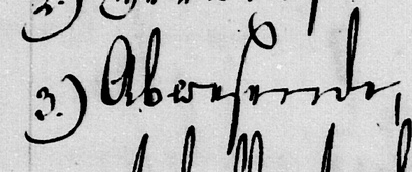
3.) Abwesende,
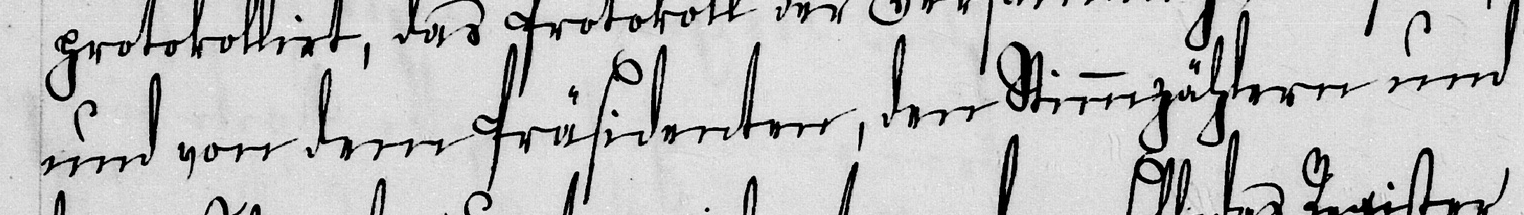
und von dem Präsidenten, den Stimmzählern und
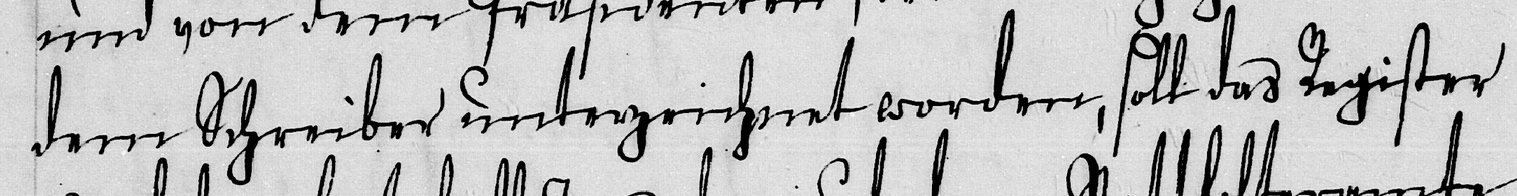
dem Schreiber unterzeichnet worden, soll das Register
